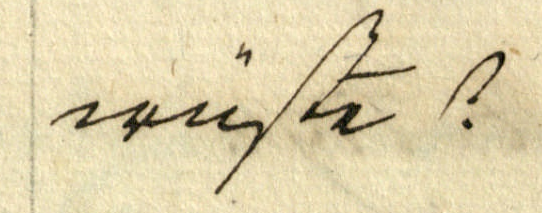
wüßte?
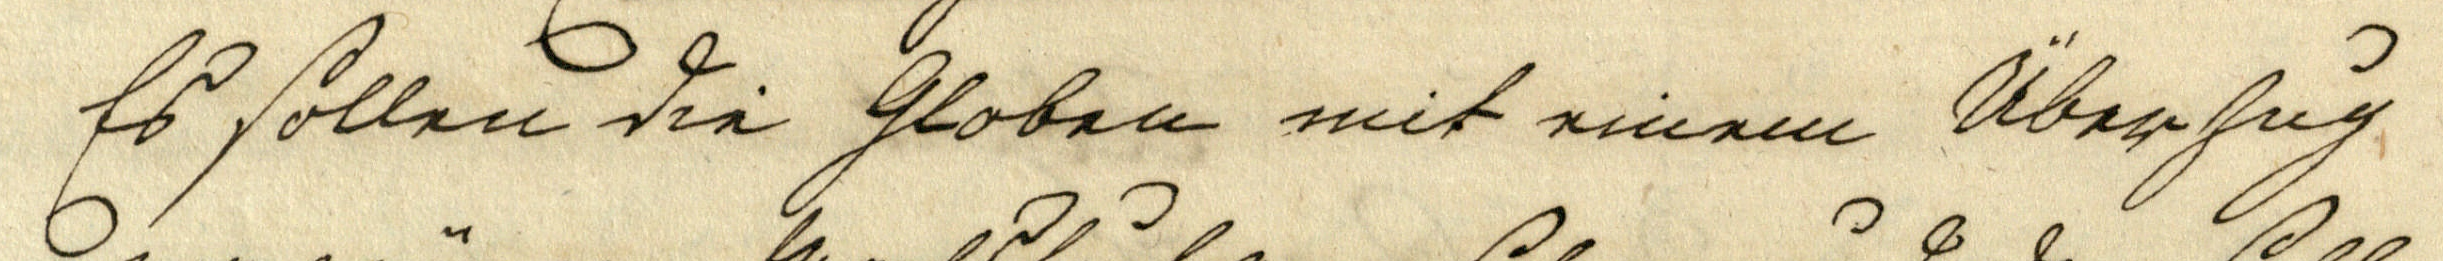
Es sollen die Globen mit einem Überzug
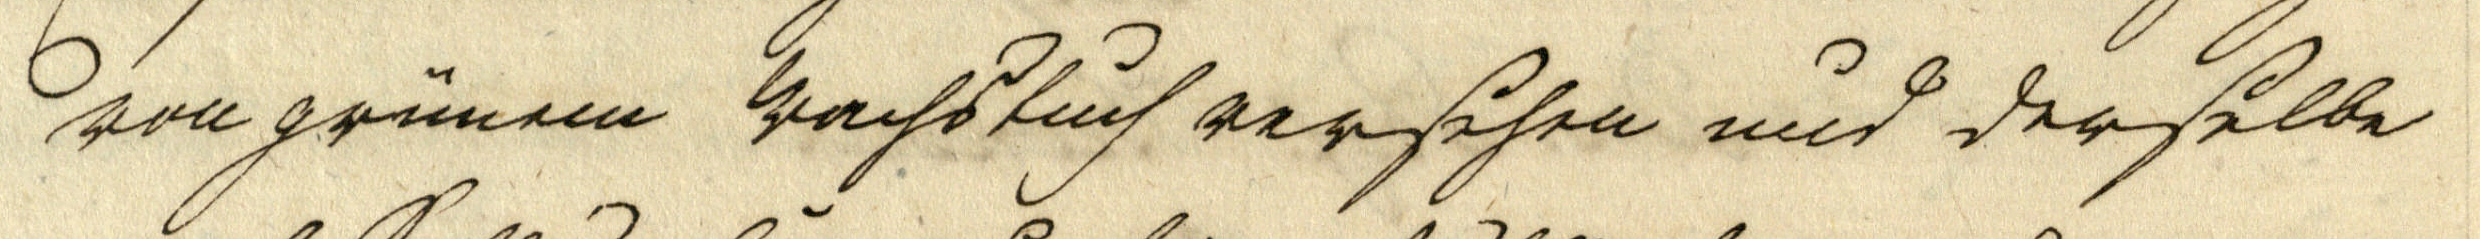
von grünem Wachstuch versehen und derselbe
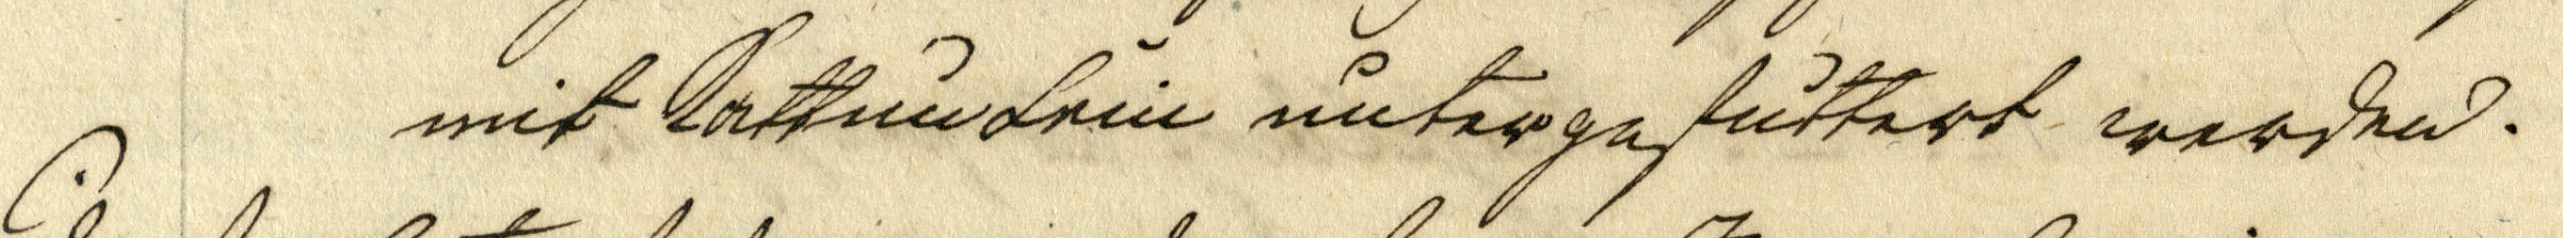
mit Kattun Lein untergefüttert werden.
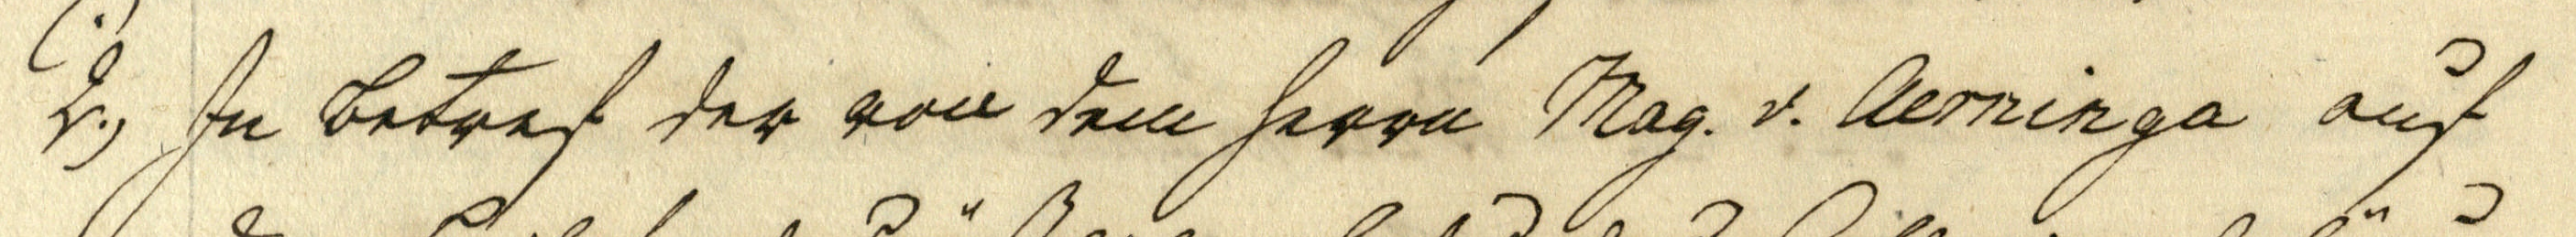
2., In Betref der von dem Herrn Mag. v. Aeminga auf
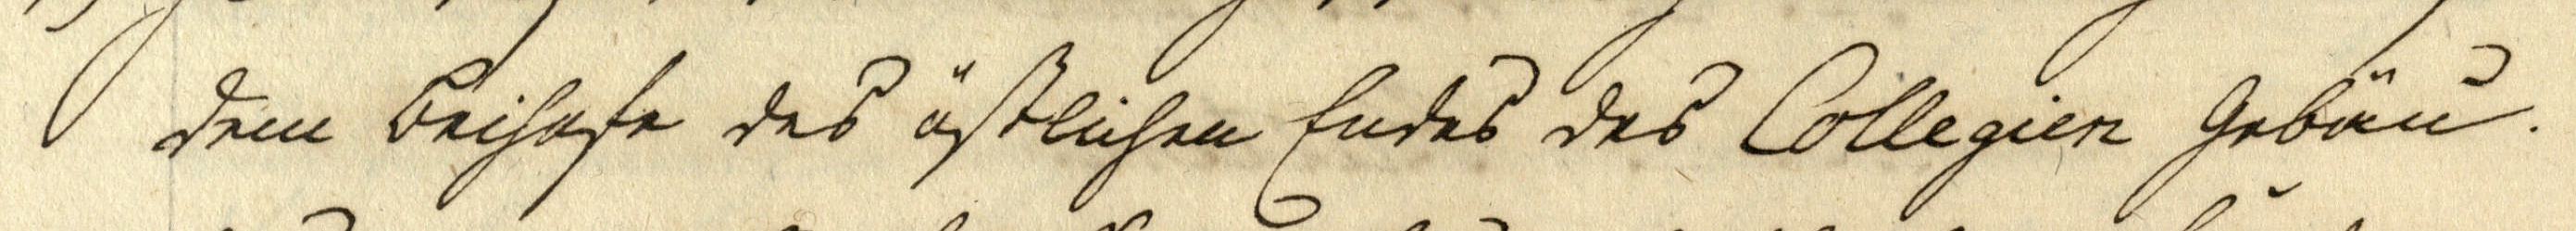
dem Beihofe des östlichen Endes des Collegien Gebäu-
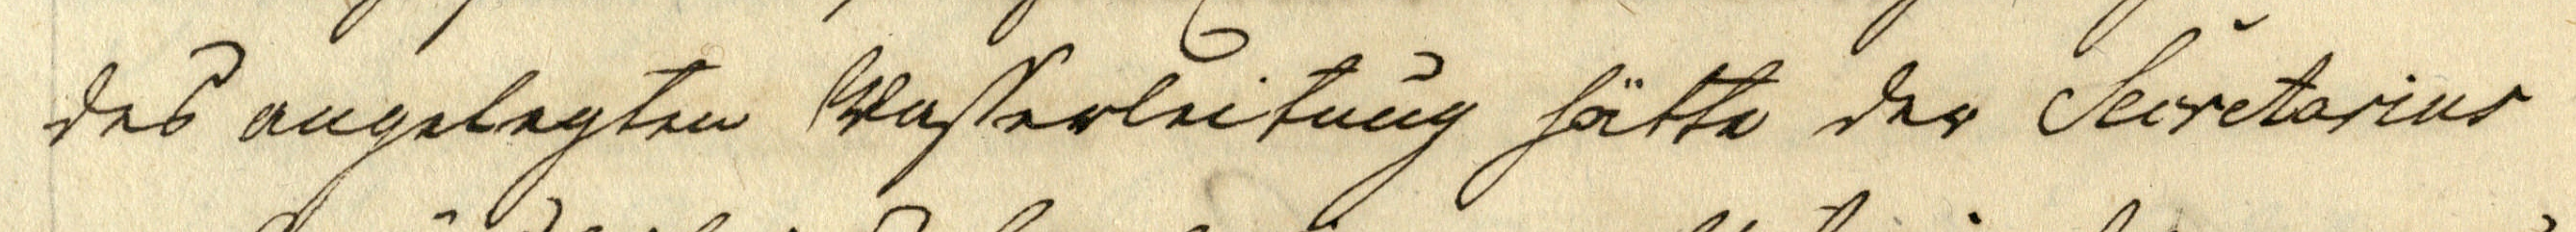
des angelegten Wasserleitung hätte der Secretarius
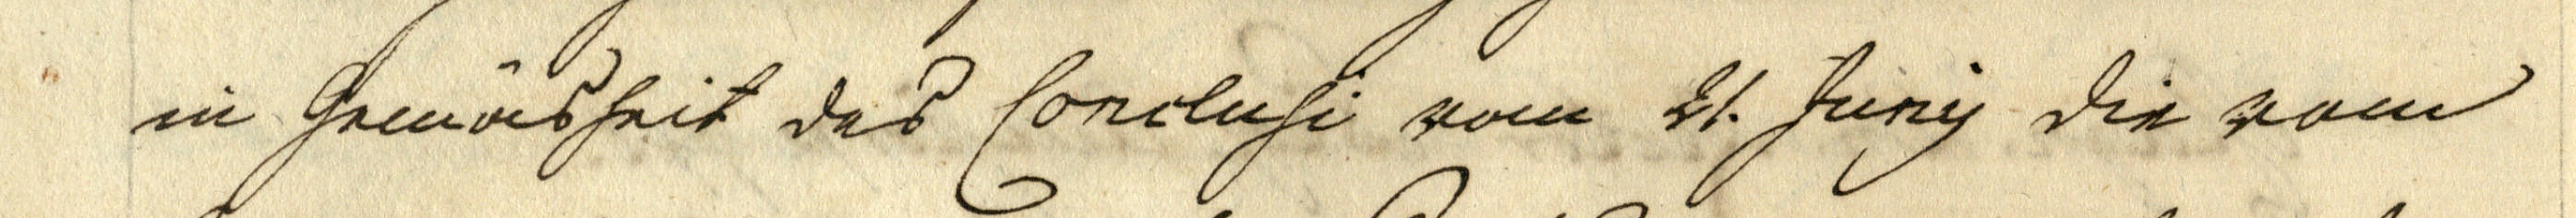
in Gemäsheit des Conclusi vom 21. Juny die vom
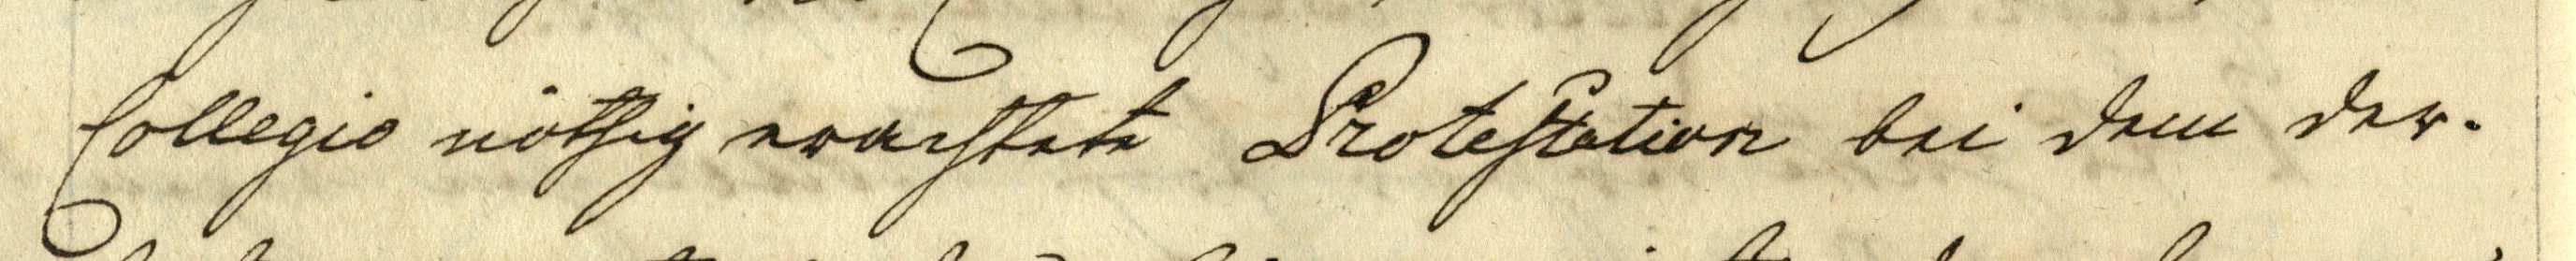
Collegio nöthig erachtete Protestation bei dem der-
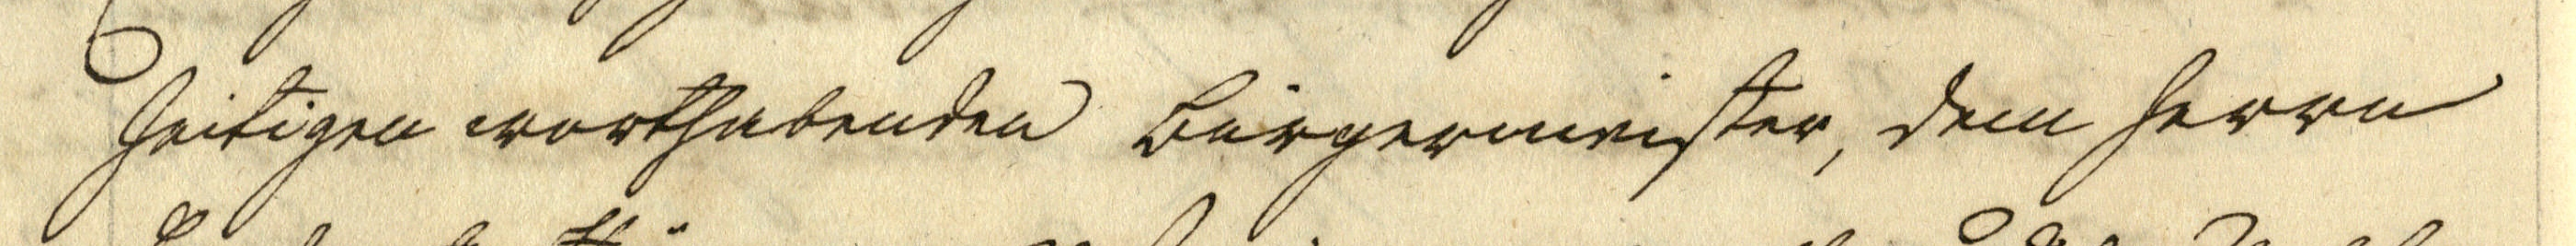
zeitigen worthaltenden Büergermeister, dem Herrn
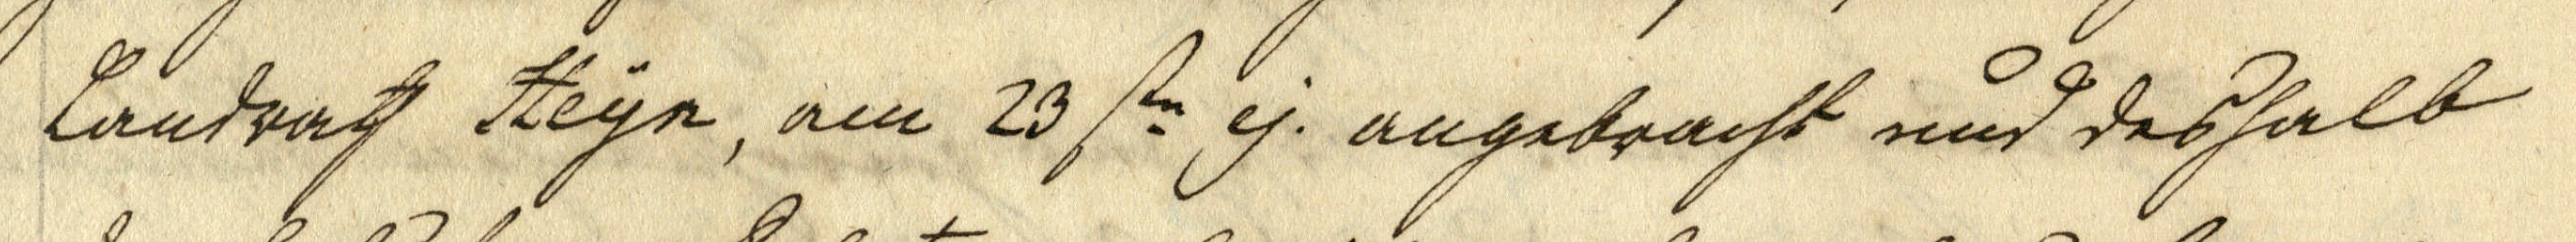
Landrath Heyn, am 23sten ej. angebracht und deshalb
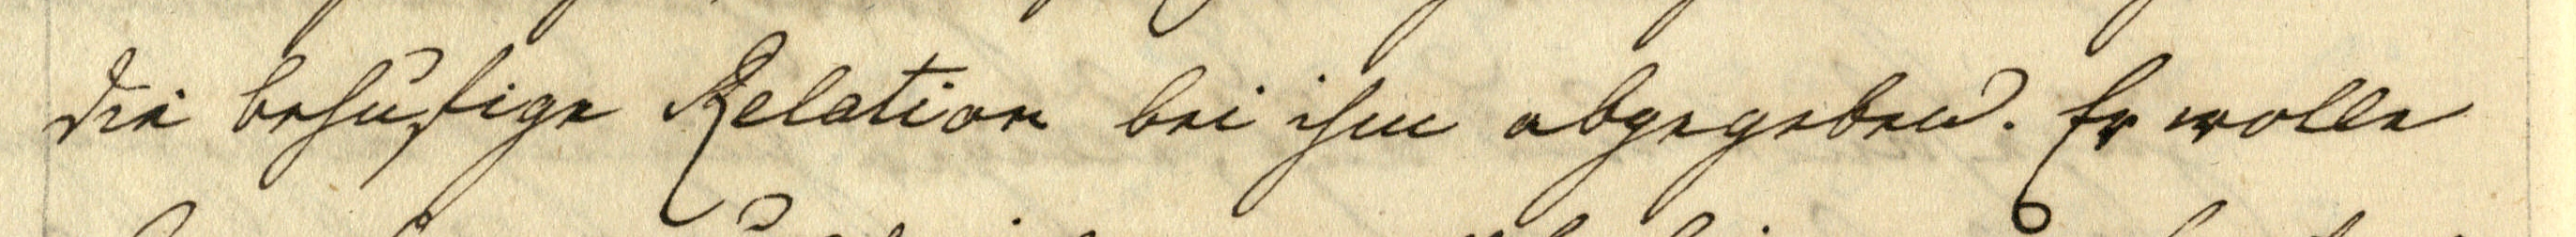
die behufige Relation bei ihm abgegeben. Er wolle
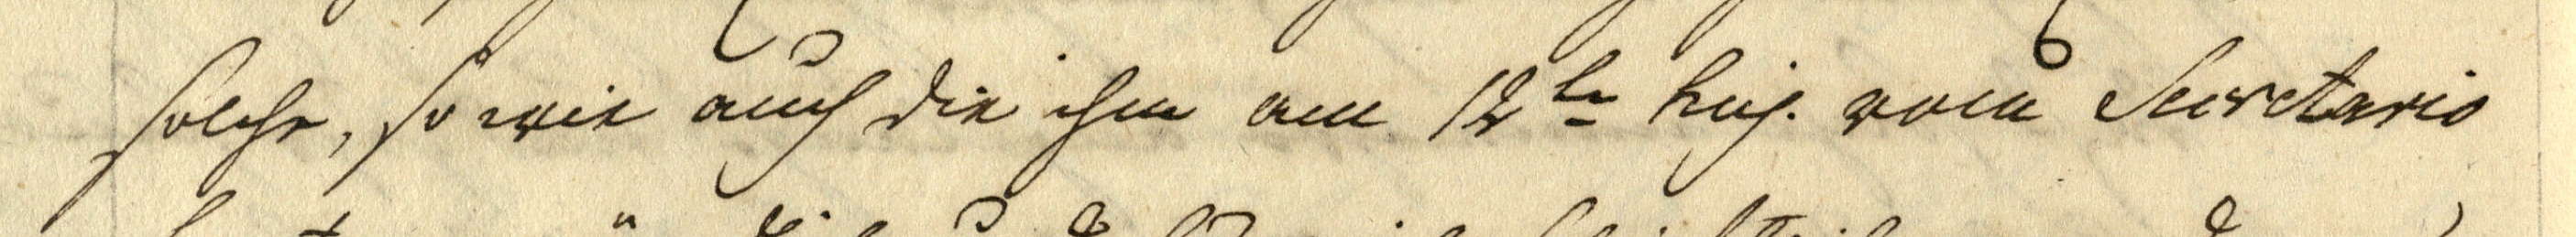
solche, so wie auch die ihm am 12ten huj. vom Secretario
